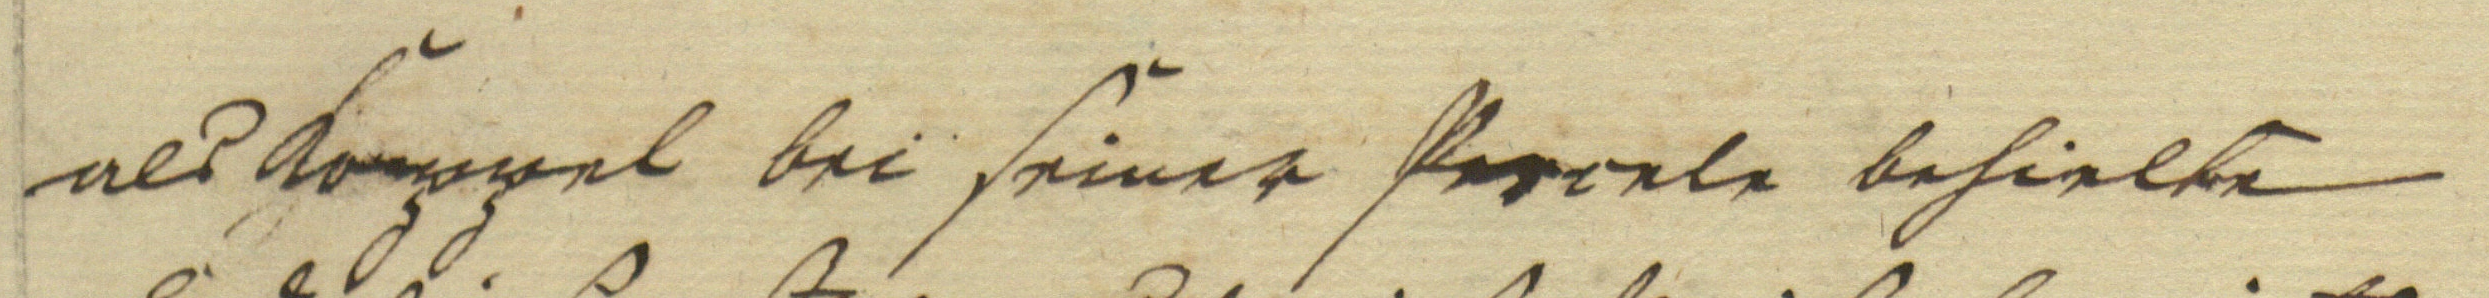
als Koppel bei seiner Percele behielte
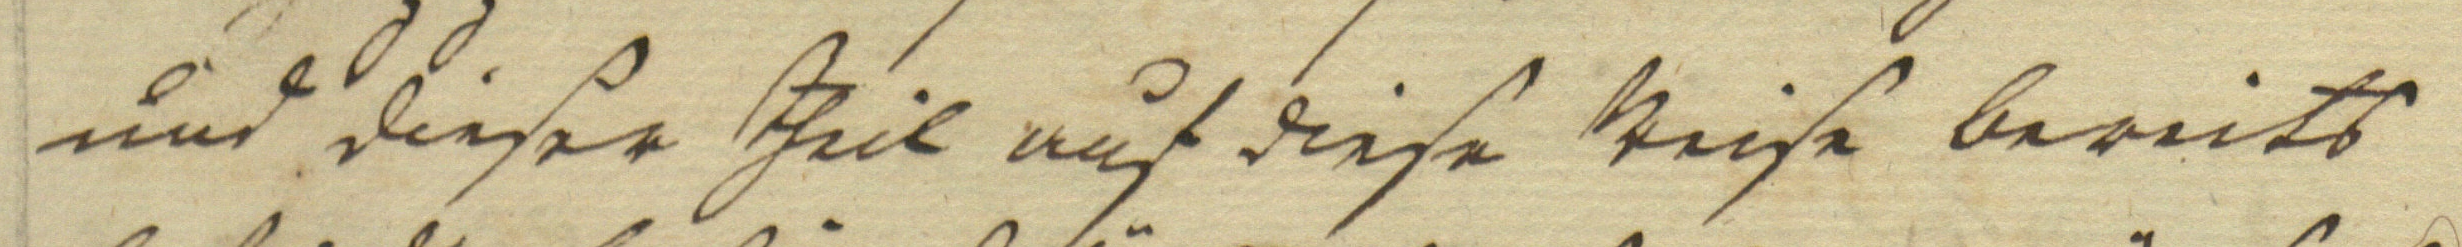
und dieser Theil auf diese Weise bereits
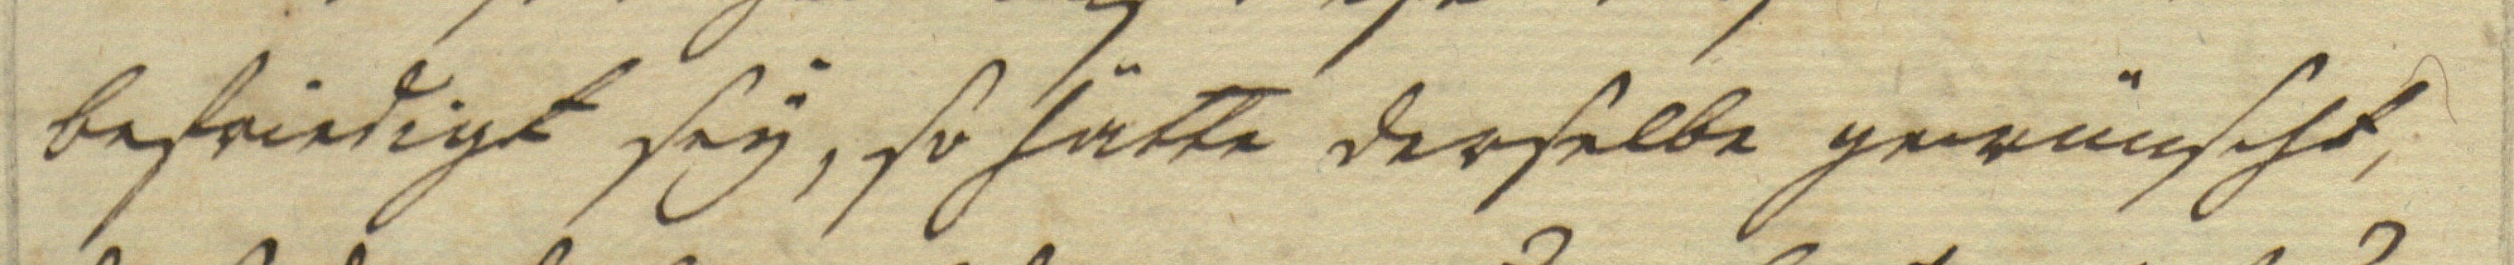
befriedigt seÿ, so hätte derselbe gewünscht,
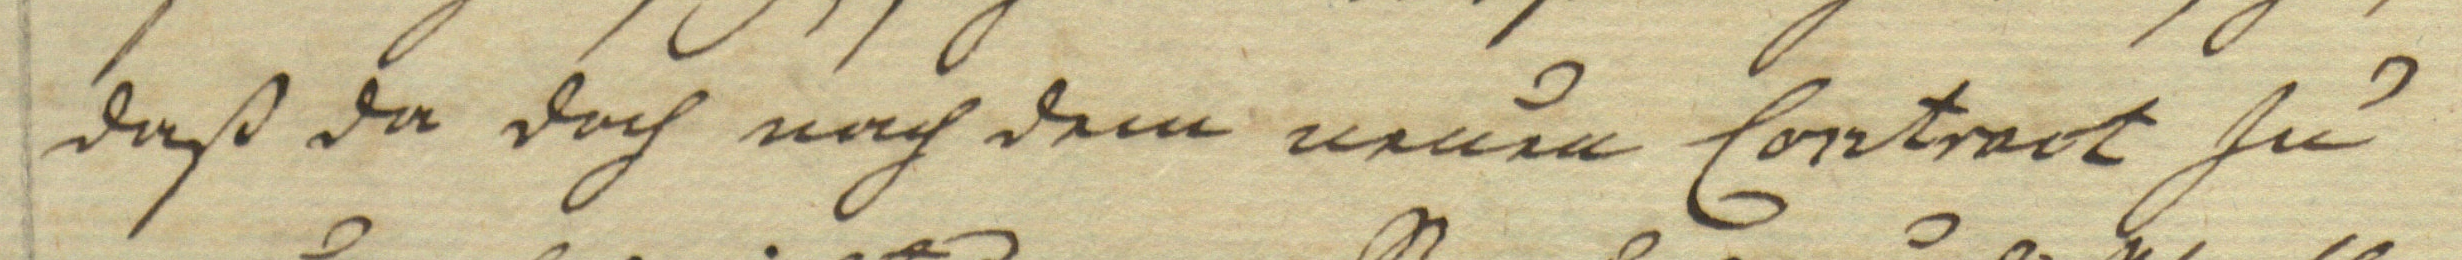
daß da doch nach dem neuen Contract zu
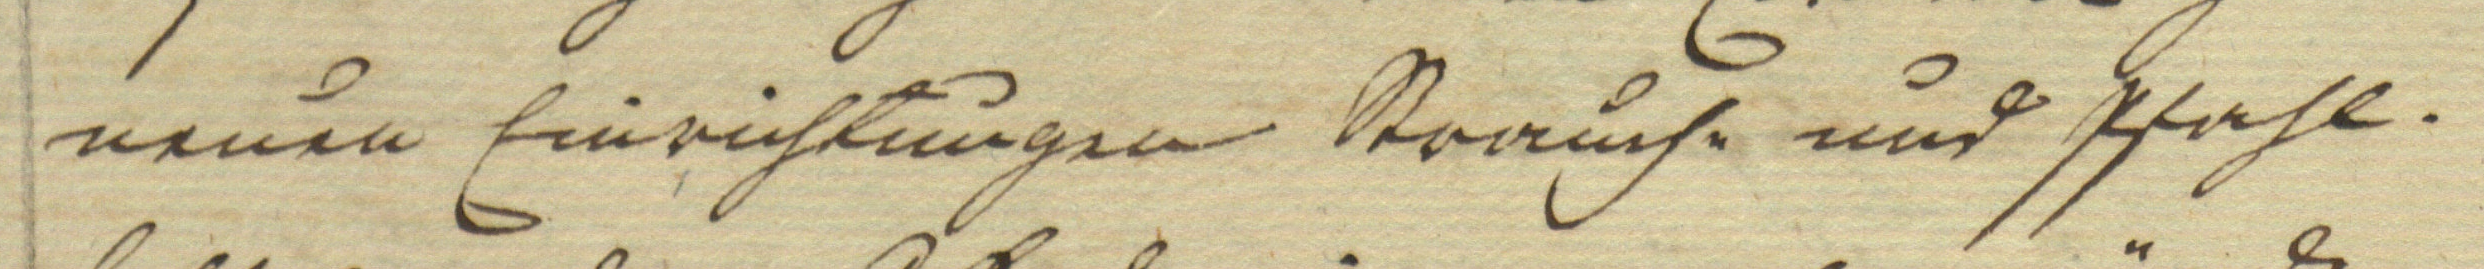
neuen Einrichtungen Strauch- und Pfahl¬
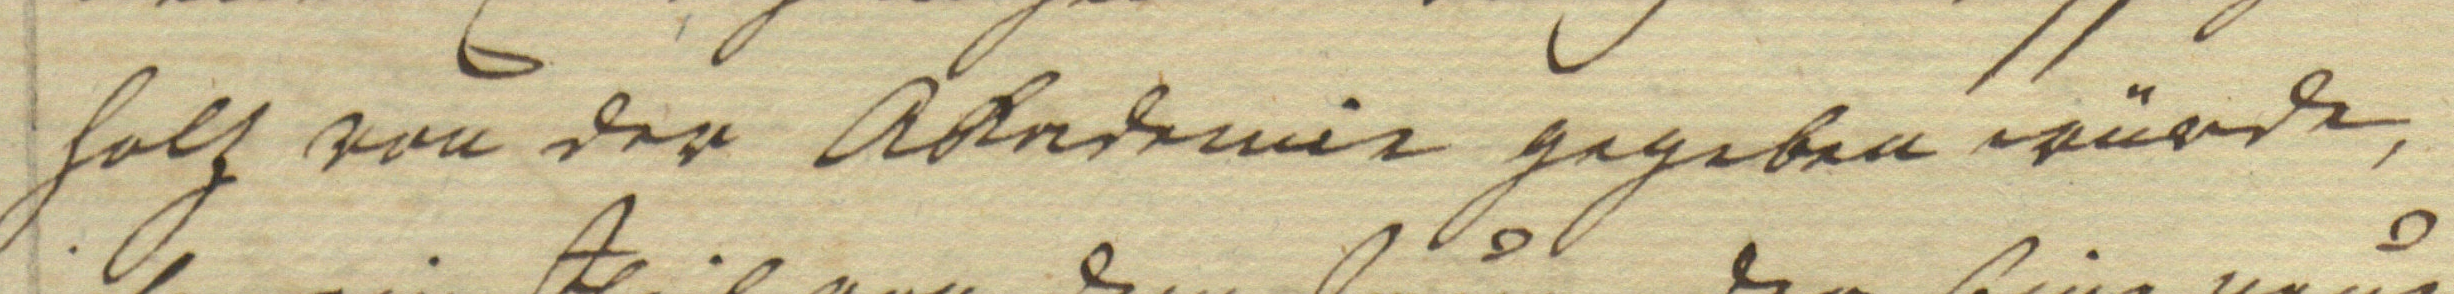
holz von der Akademie gegeben würde,
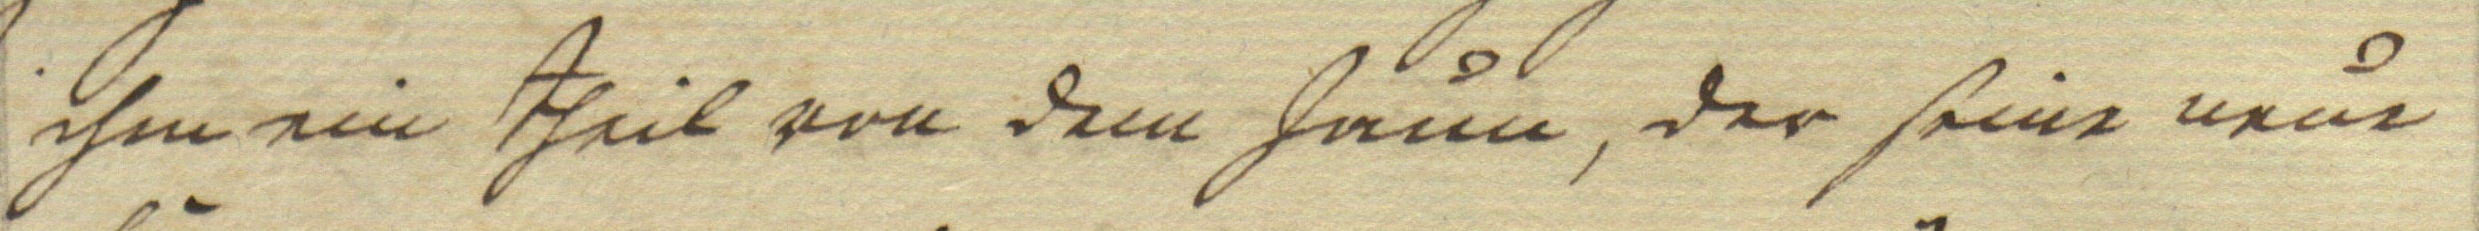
ihm ein Theil von dem Zaun, der seine neue
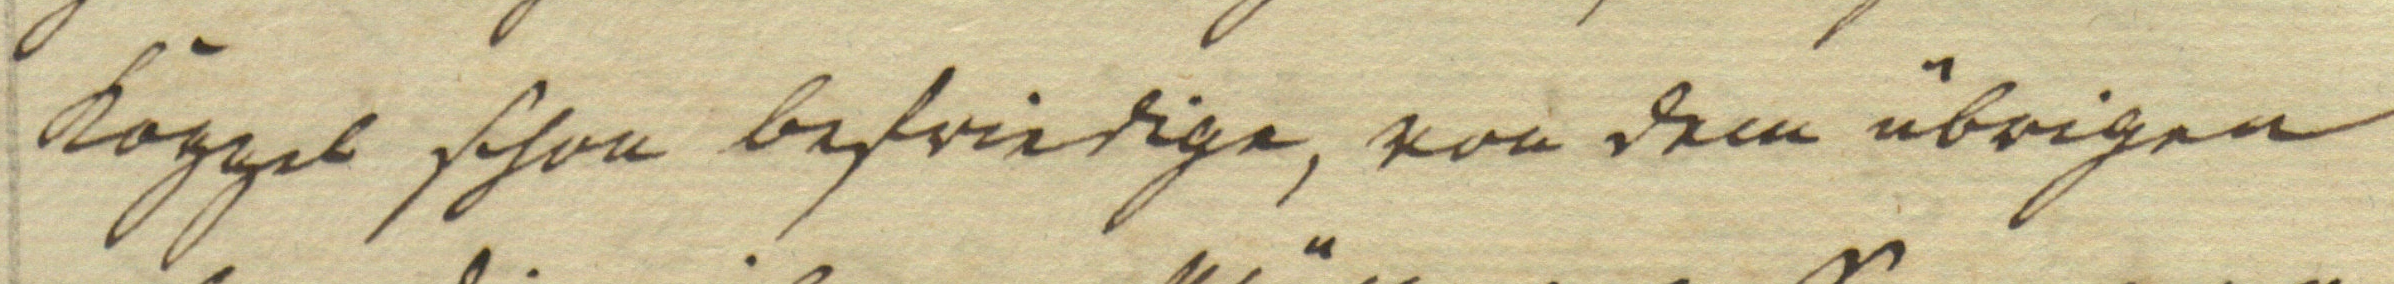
Koppel schon befriedige, von dem übrigen
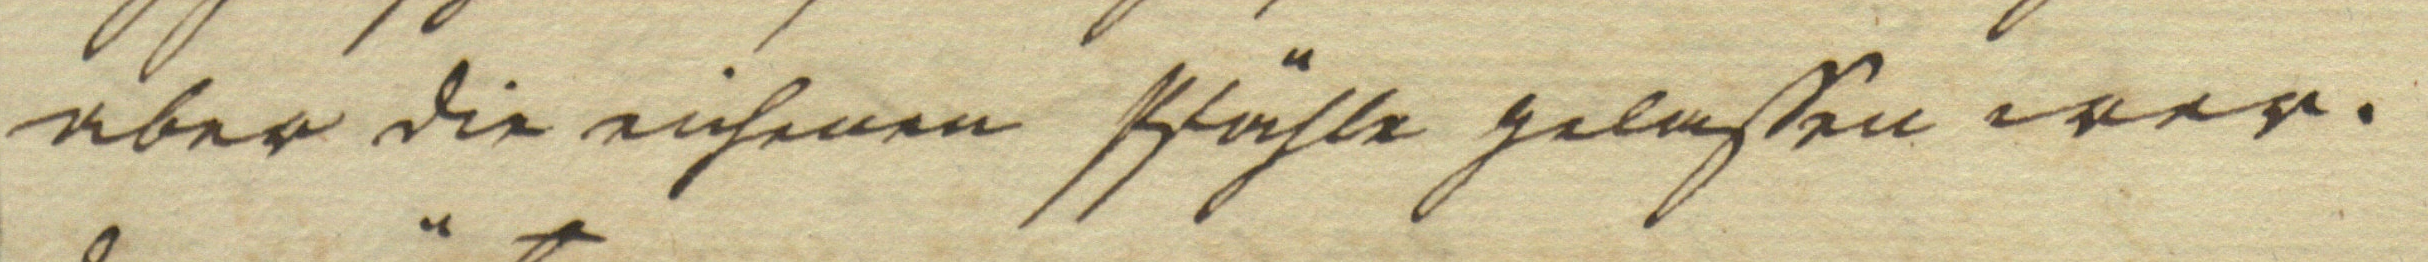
aber die eichenen Pfähle gelassen wer-
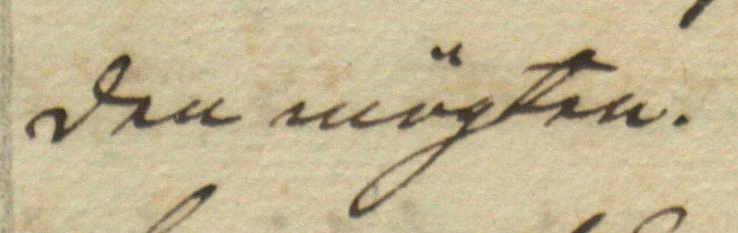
den mögten.
